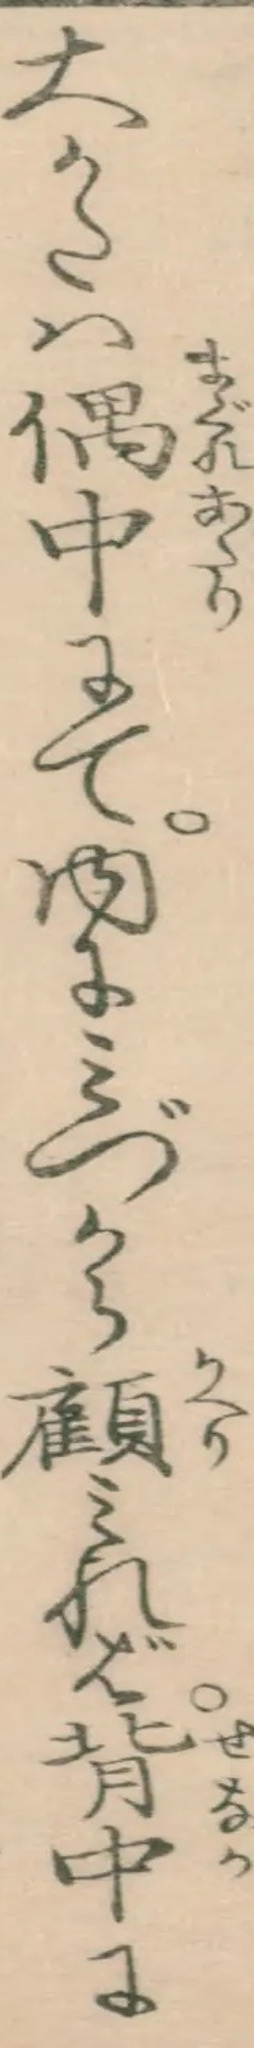大かたは偶中にて。内にみづから顧みれば。背中に
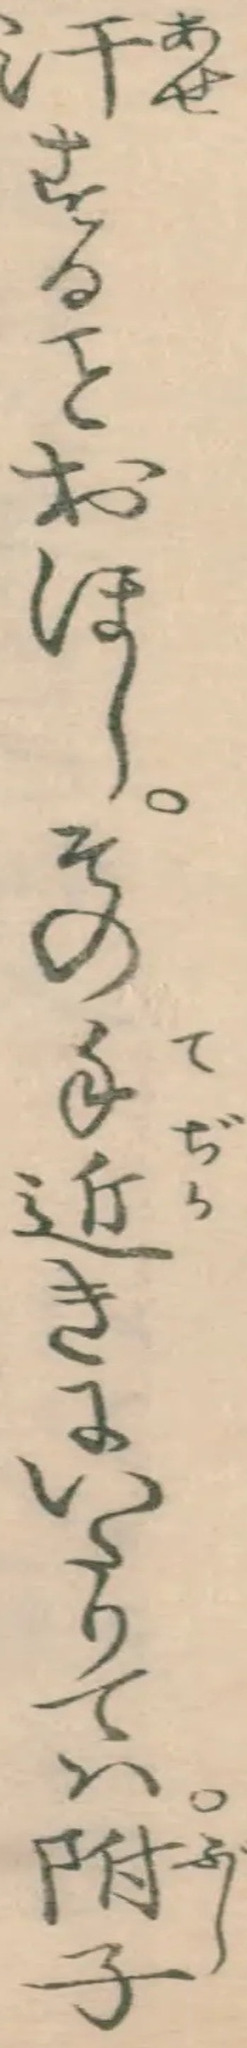汗することおほし。その手近きにいたりては。附子
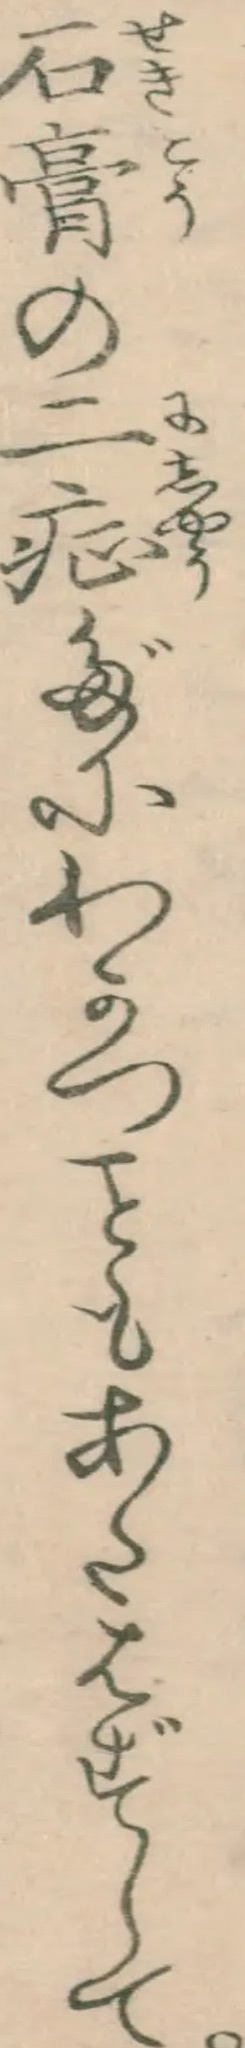石膏の二症だにわかつこともあたはずして。
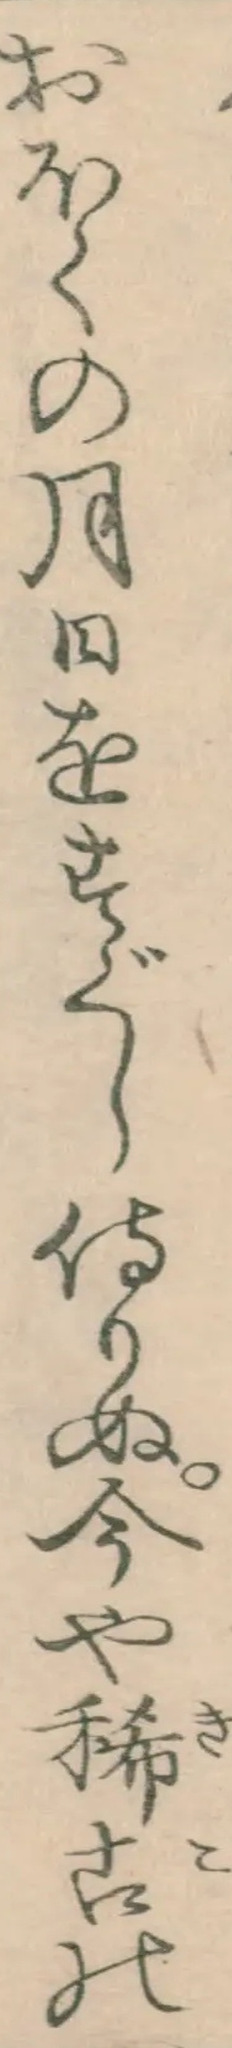おほくの月日をすぐし待りぬ。今や稀古の
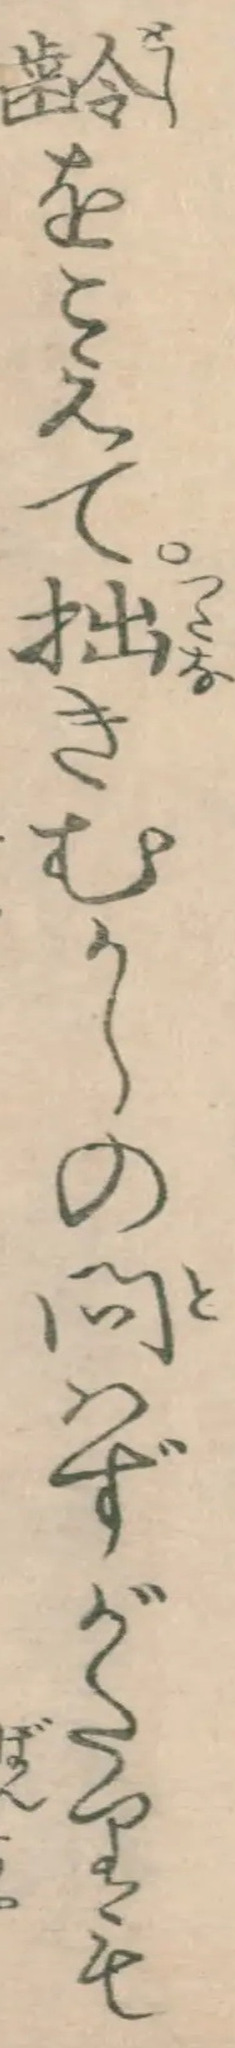齢をこえて。拙きむかしの問はずがたりも
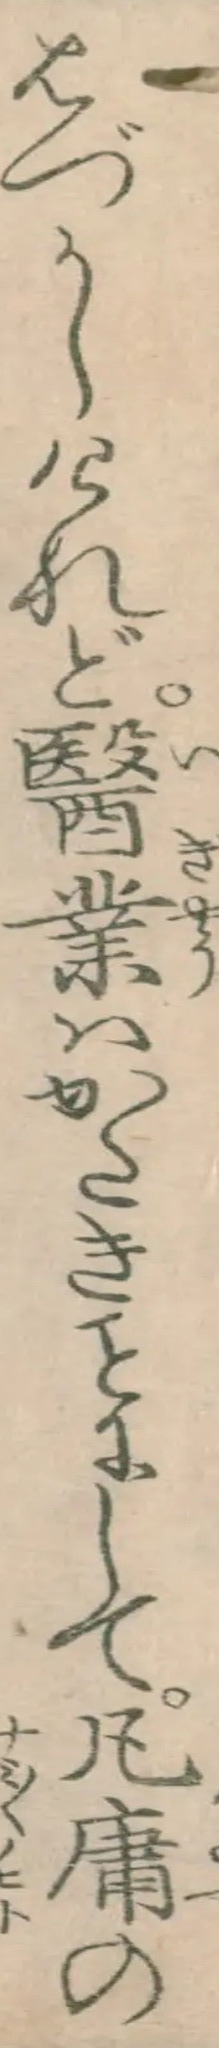はづかしけれど。醫業はかたきことにして。凡庸の
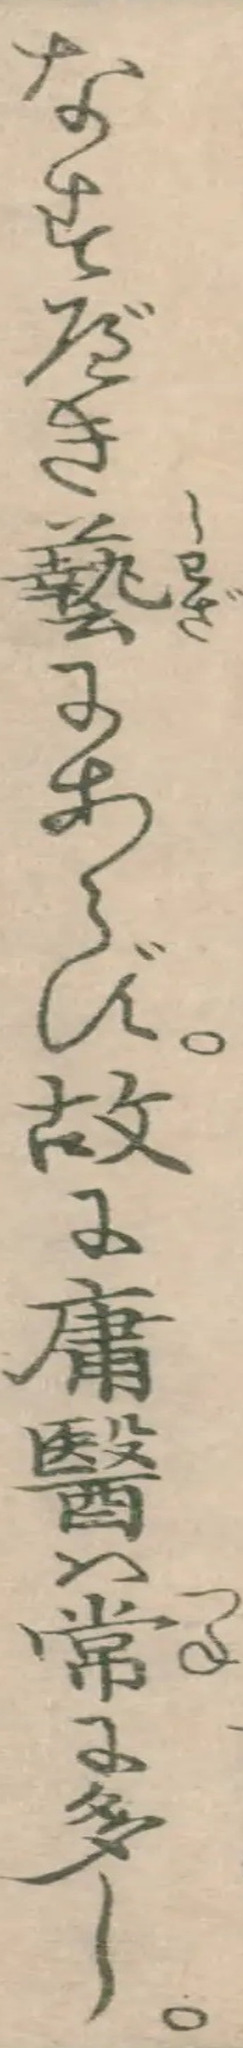なすべき藝にあらず。故に庸醫は常に多し。

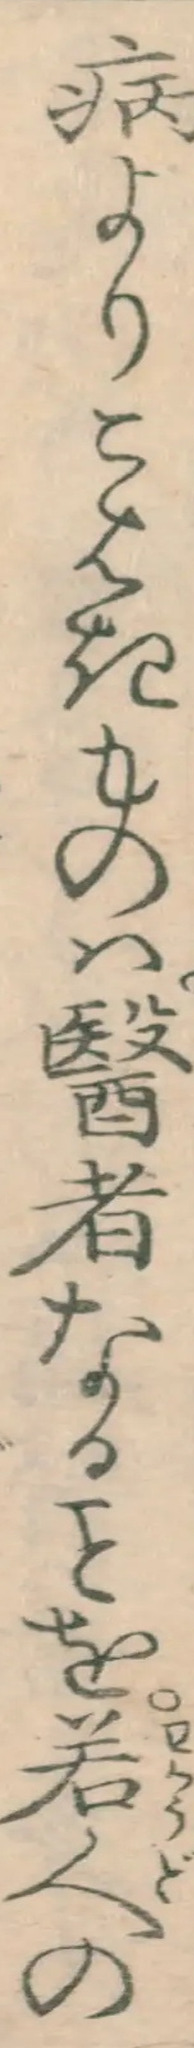病よりこはきものは。醫者なることを。若人の
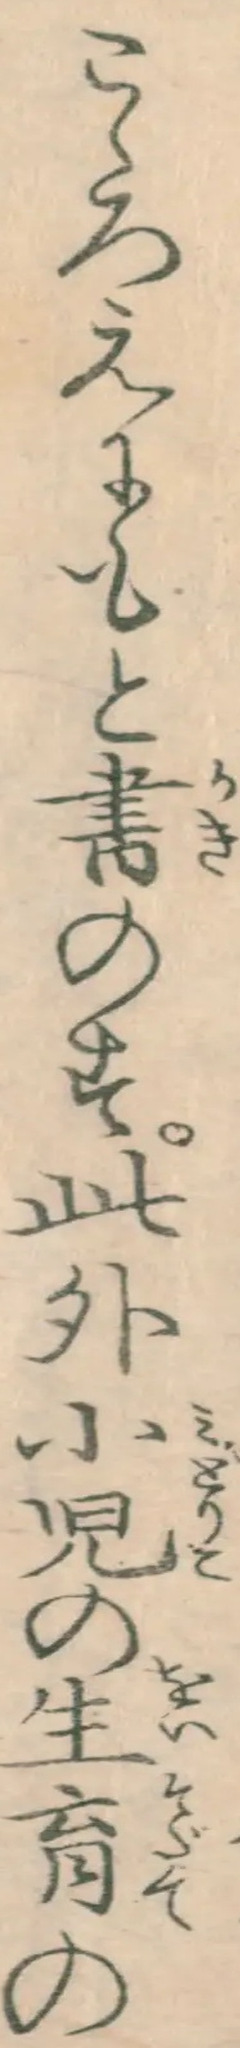こゝろえにもと書のす。此外小児の生育の
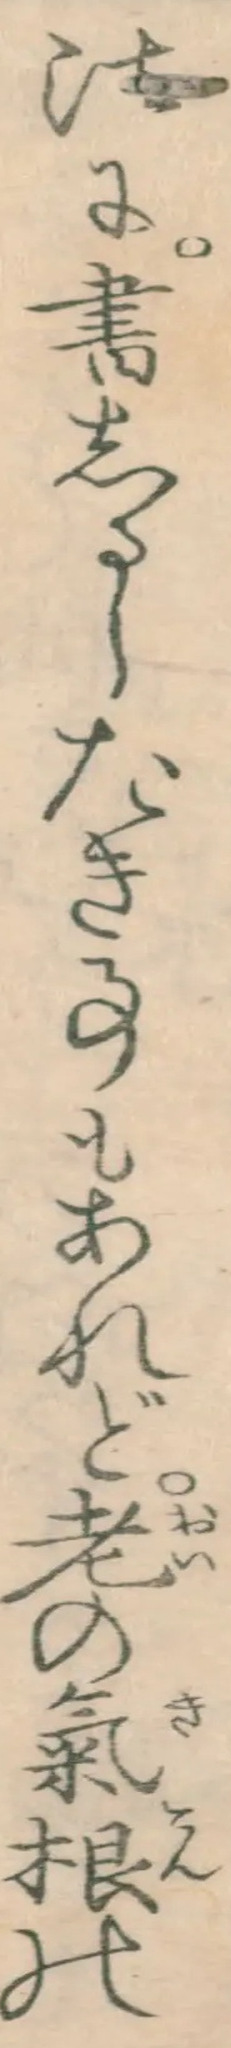に。書しるしたき事もあれど。老の氣根の
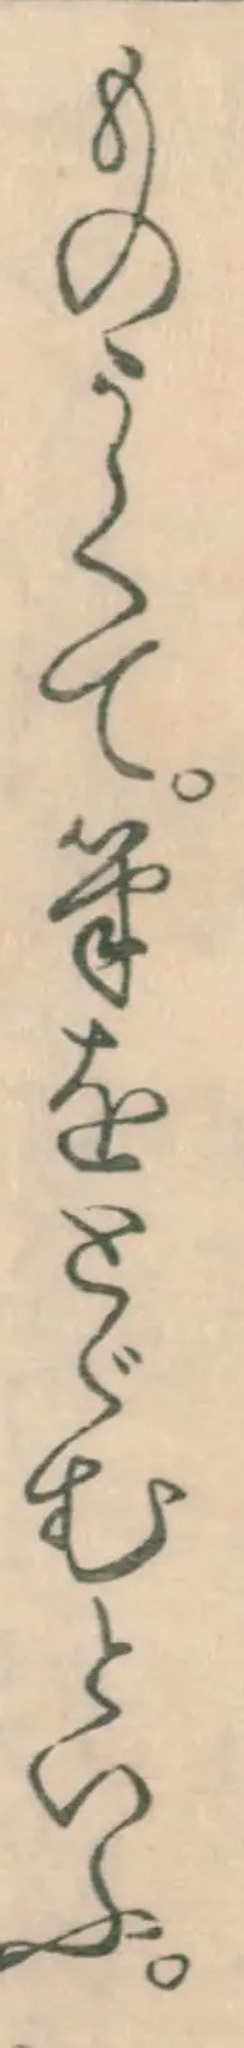ものうくて。筆をとゞむといふ。
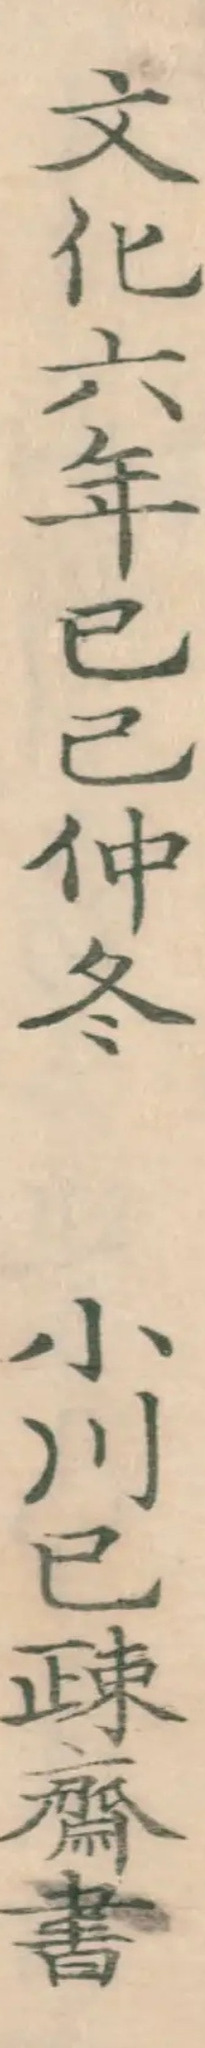文化六年巳己仲冬小川巳疎齋書
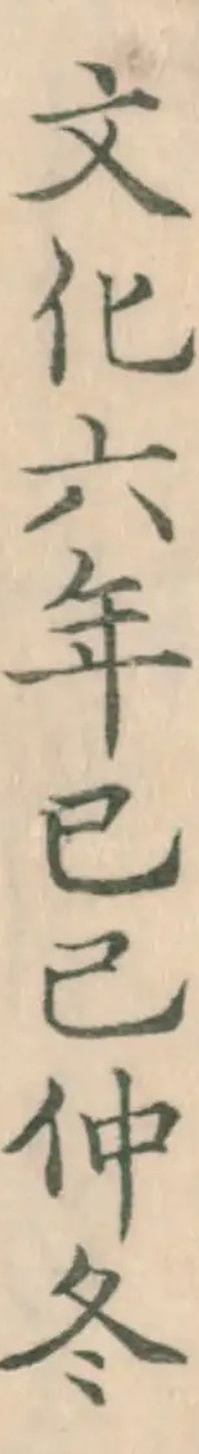文化七年庚午仲冬
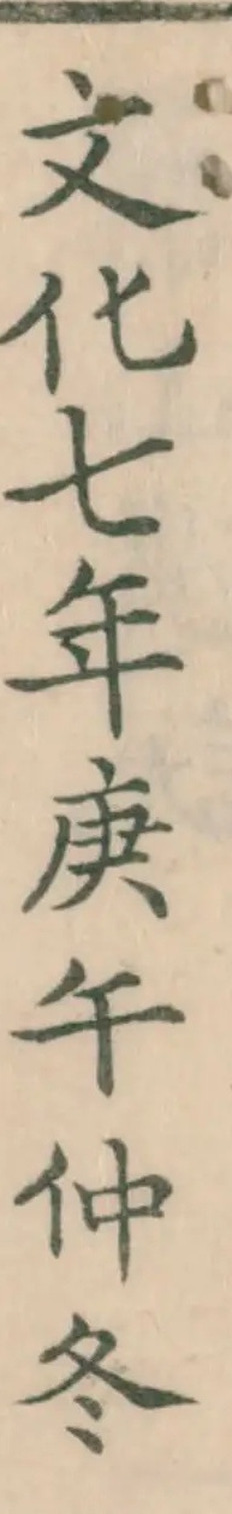文化七年庚午仲冬
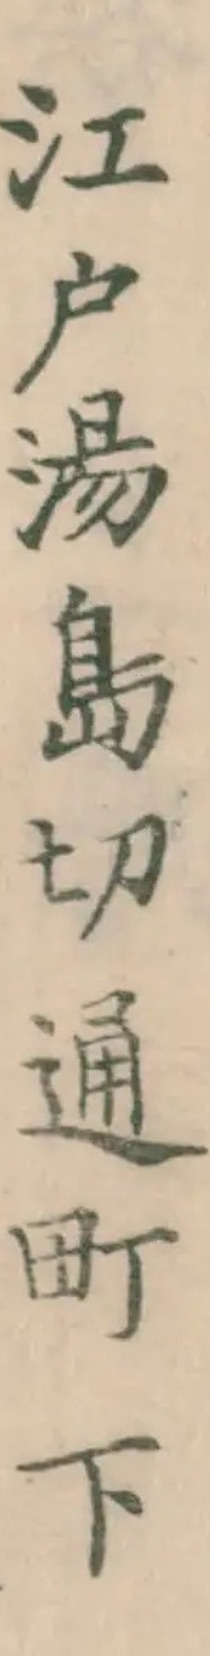江戸湯島切通町下
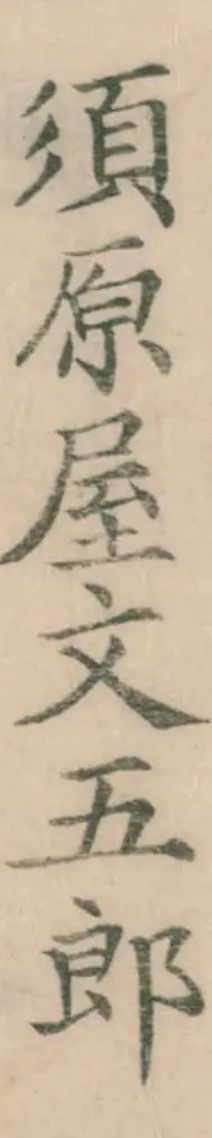須原屋文五郎
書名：瘡家示訓
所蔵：国立国会図書館 National Diet Library, JAPAN
